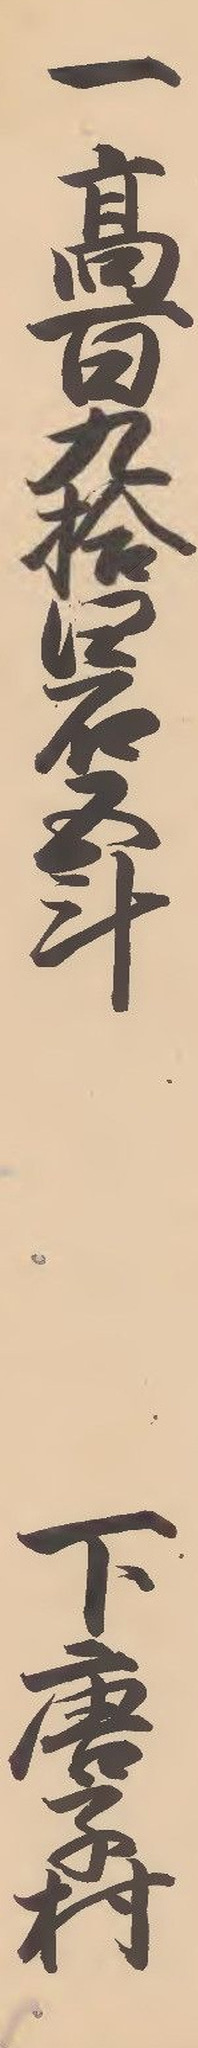一高百九拾四石五斗下唐子村

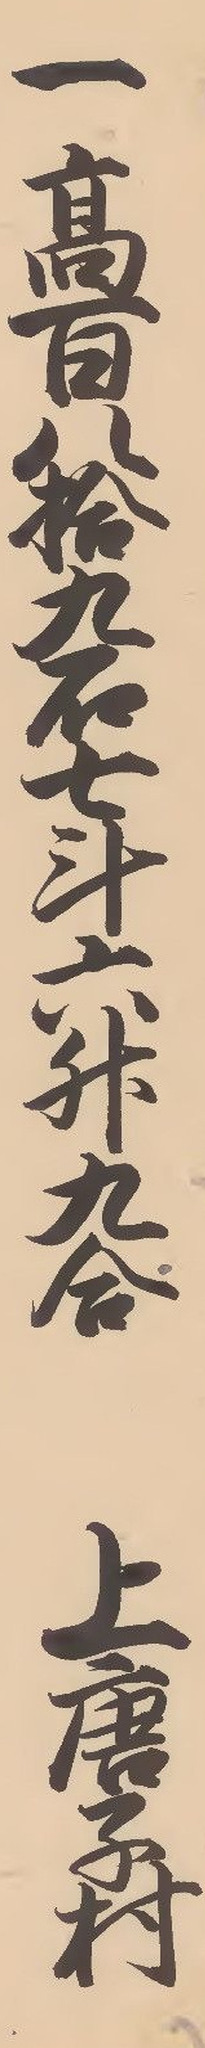一高百八拾九石七斗六升九合上唐子村
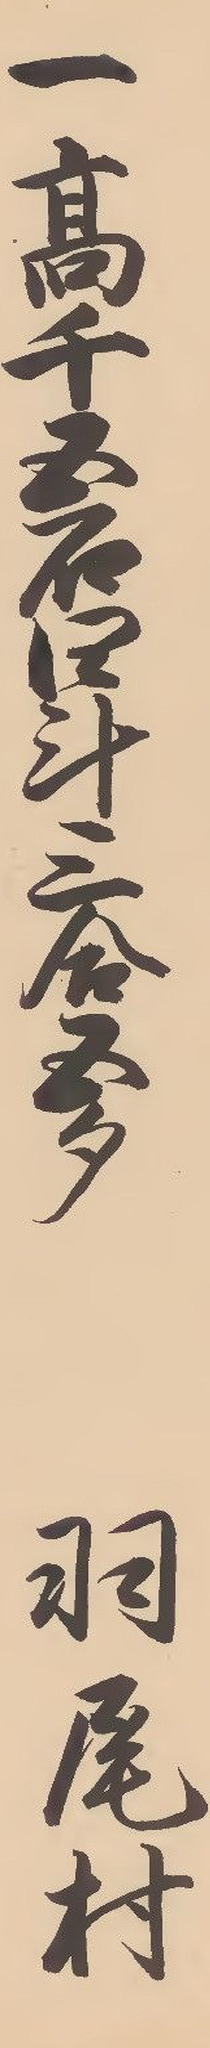一高千五石四斗三合五勺羽尾村
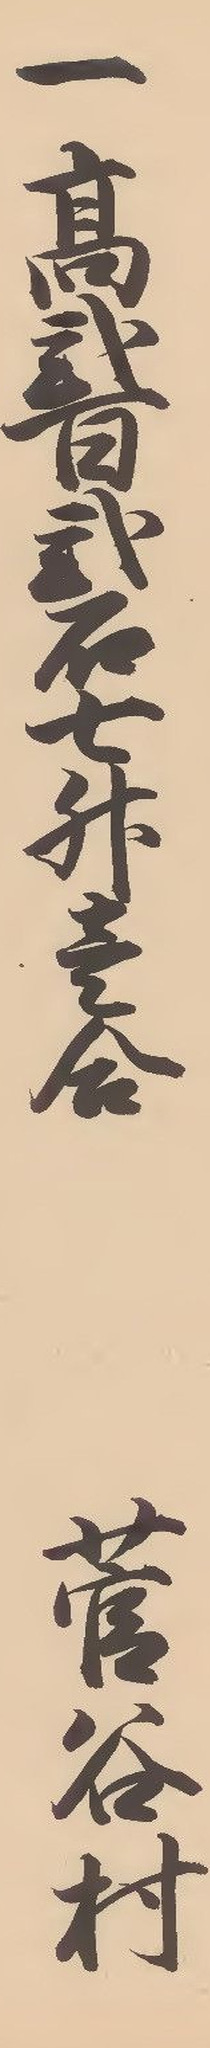一高弐百弐石七升壱合菅谷村
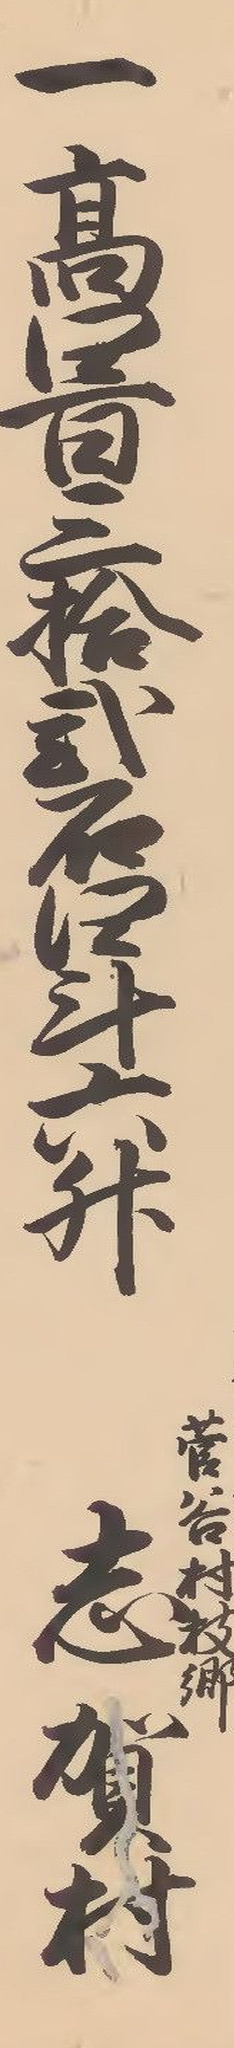一高四百三拾弐石四斗六升志賀村
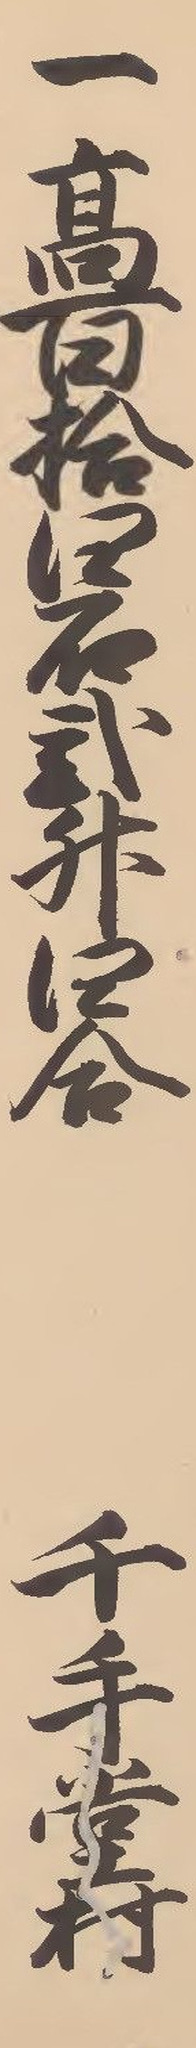一高百拾四石弐升四合千手堂村
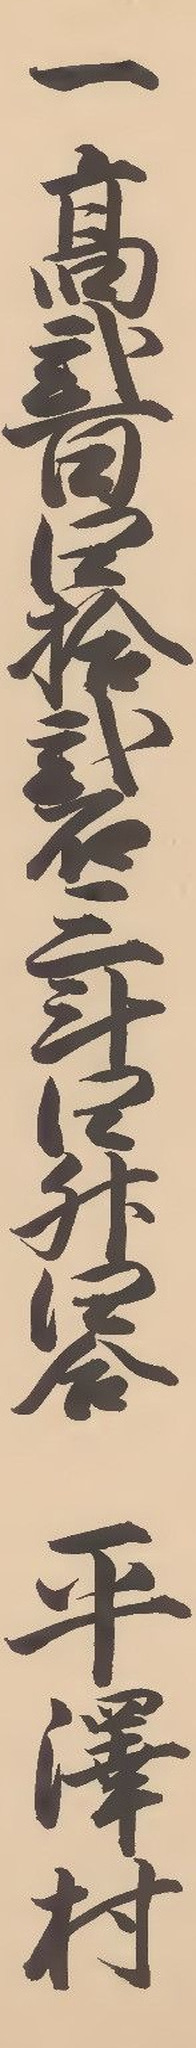一高弐百四拾弐石三斗四升四合平澤村
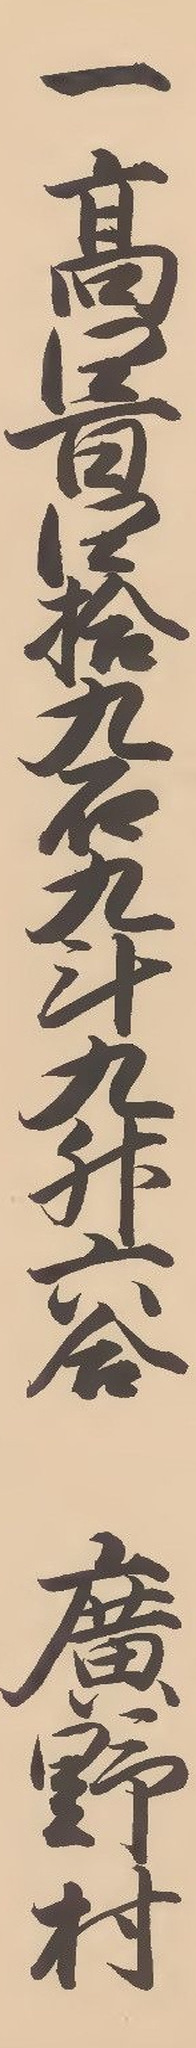一高四百四拾九石九斗九升六合廣野村

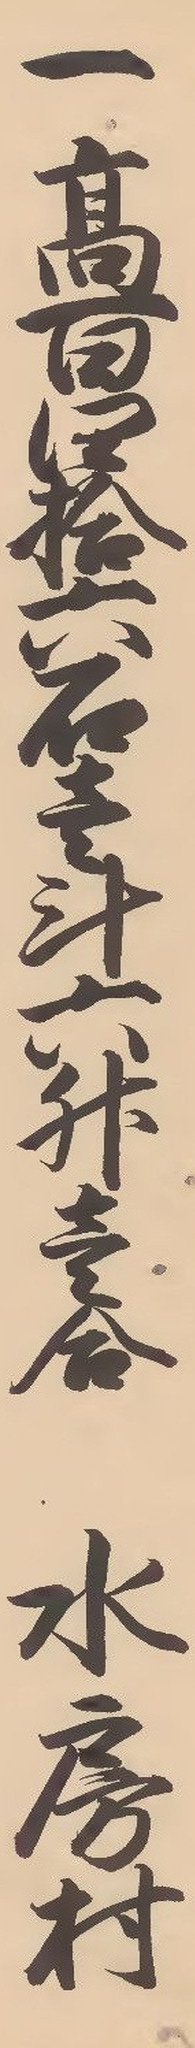一高百四拾六石壱斗六升壱合水房村
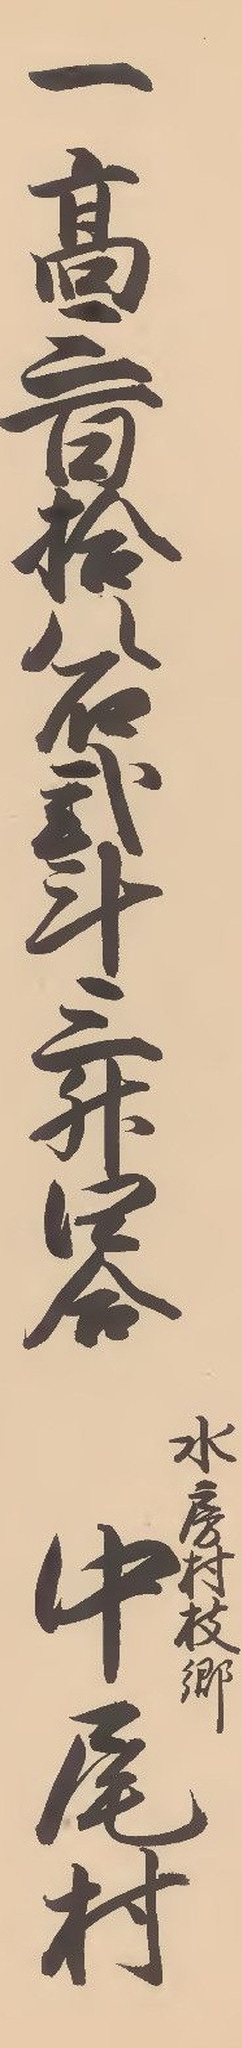一高三百拾八石弐斗三升四合中尾村
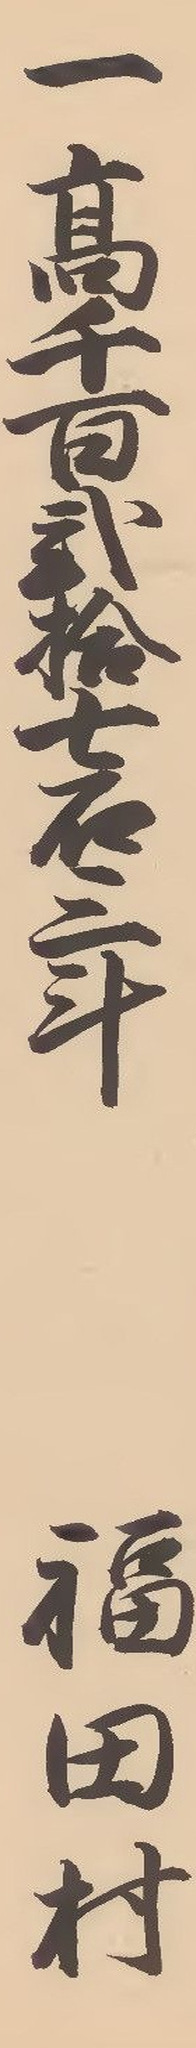一高千百弐拾七石三斗福田村
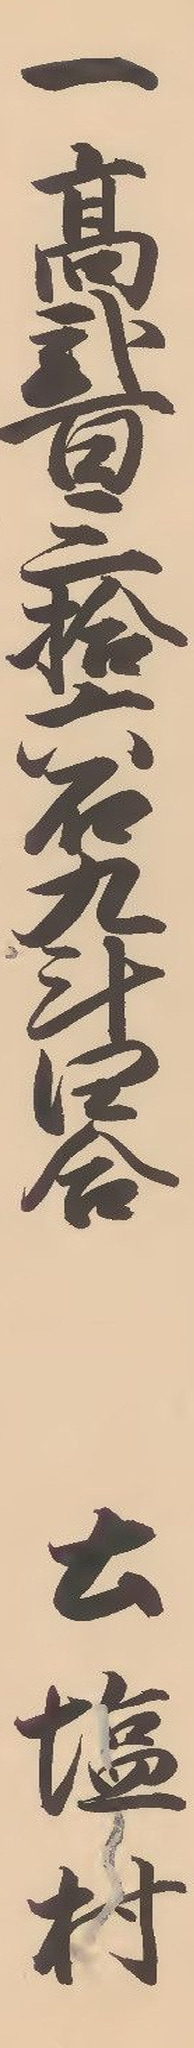一高弐百三拾六石九斗四合土塩村
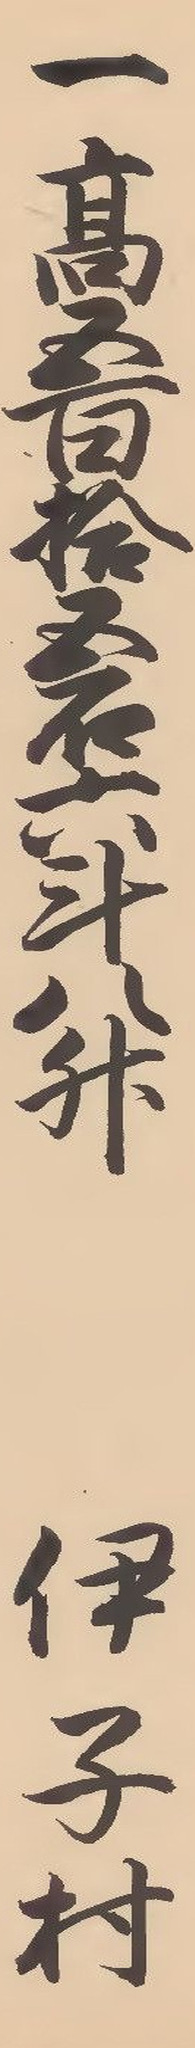一高五百拾五石六斗八升伊子村
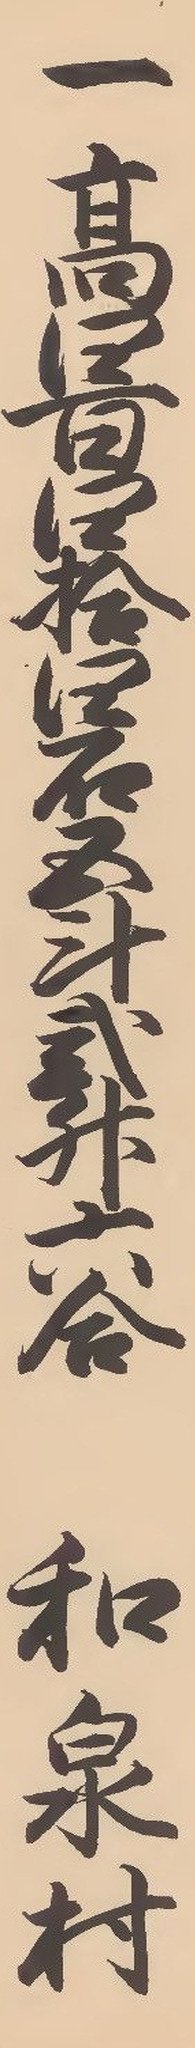一高四百四拾四石五斗弐升六合和泉村
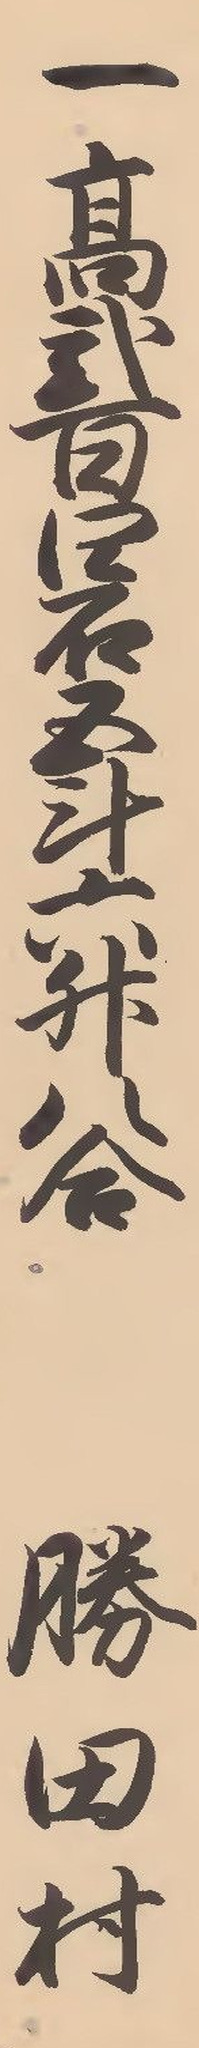一高弐百四石五斗六升八合勝田村
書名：武蔵国郷帳　下
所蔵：国立公文書館 National Archives of Japan
